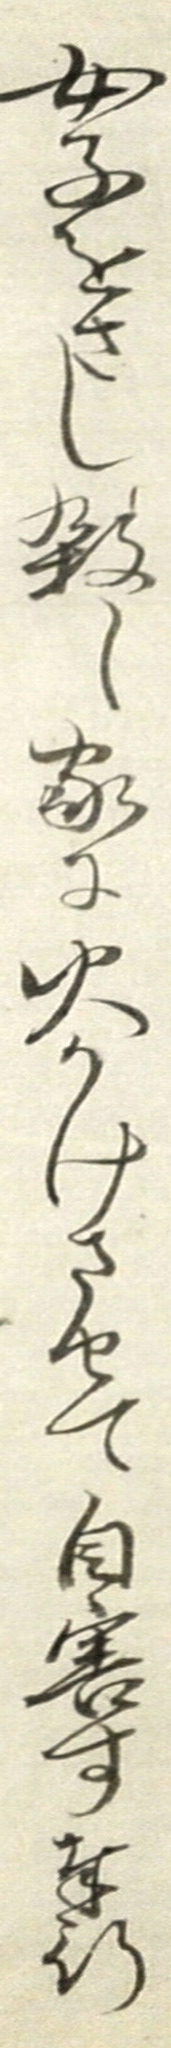女子をさし殺し家に火かけさせて自害す奉行
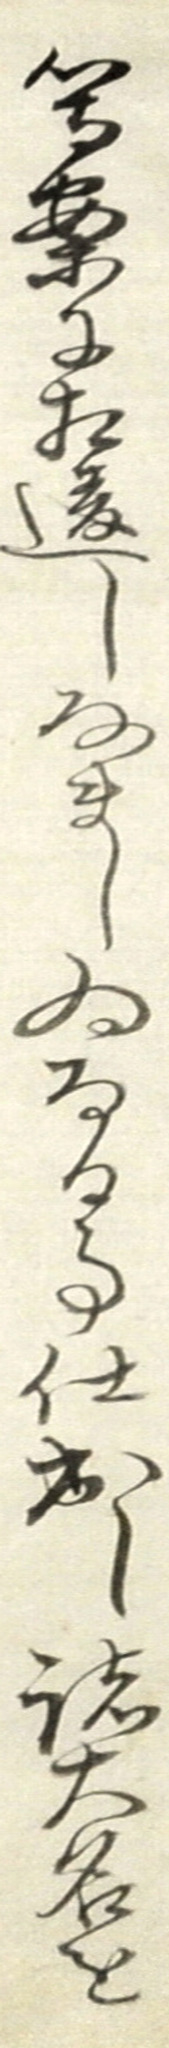等案に相違しなましゐなる事仕出し諸大名を
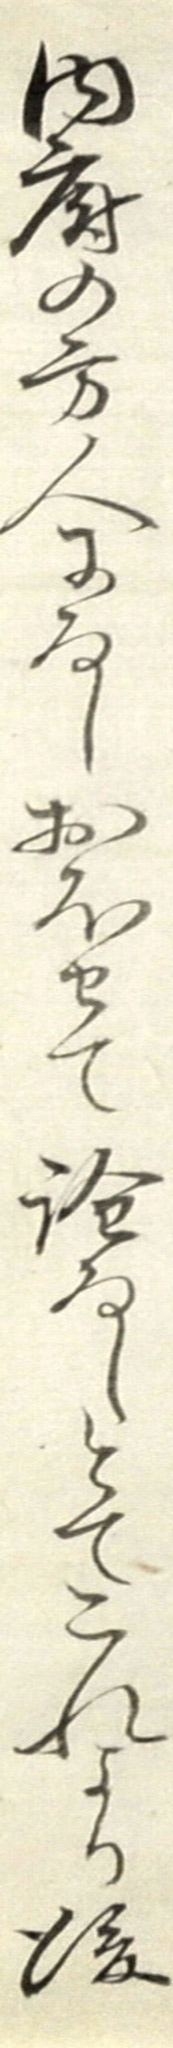内府の方人になしおほせて詮なしとてこれより後
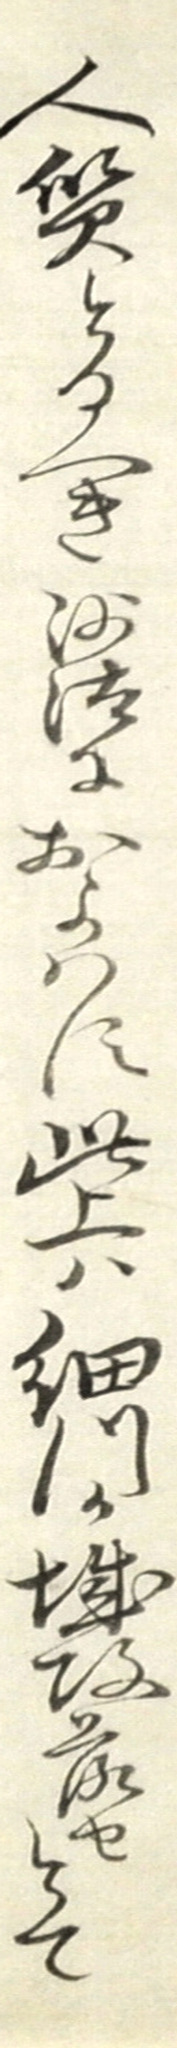人質とるへき沙汰におよはす此上は細川か城攻落せとて
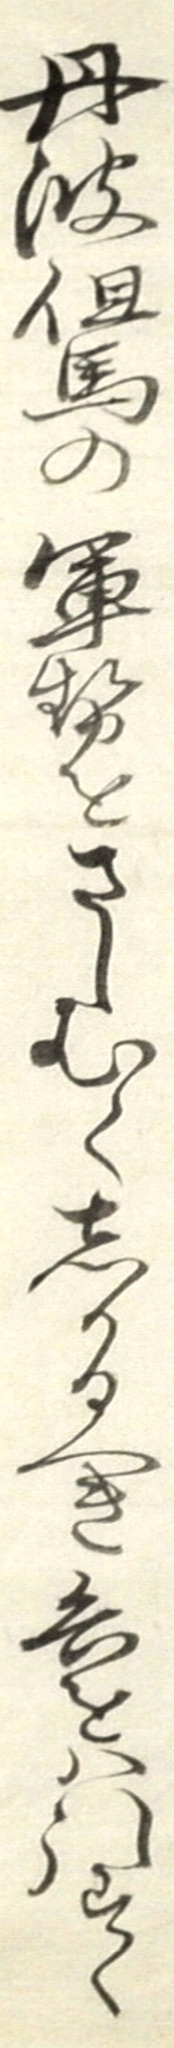丹波但馬の軍勢をさしむくしかるへき兵をは引すく
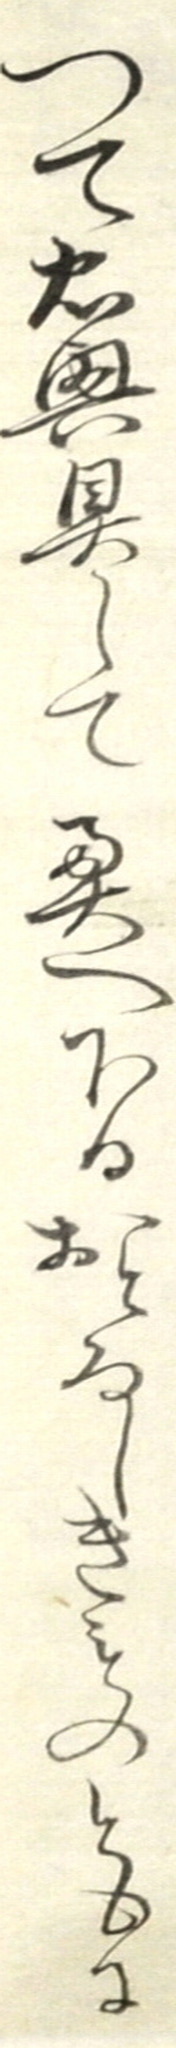つて忠興具して奥へ下るおとなしきものともに
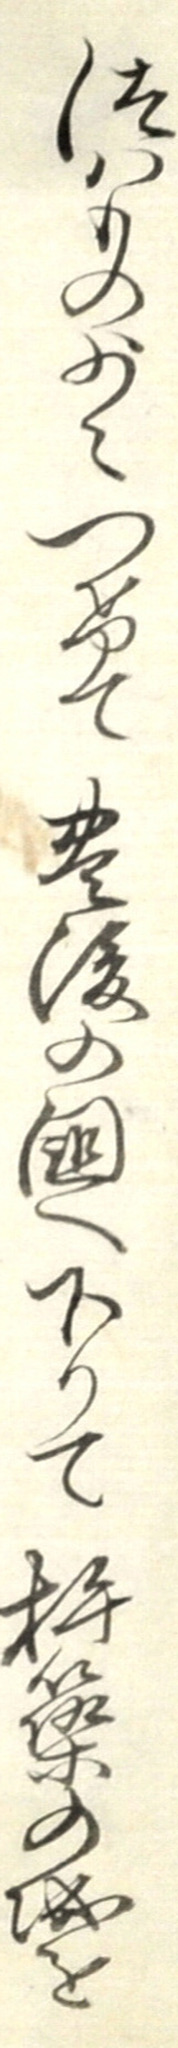つはもの少々つけて豊後の国へ下りて杵築の城を
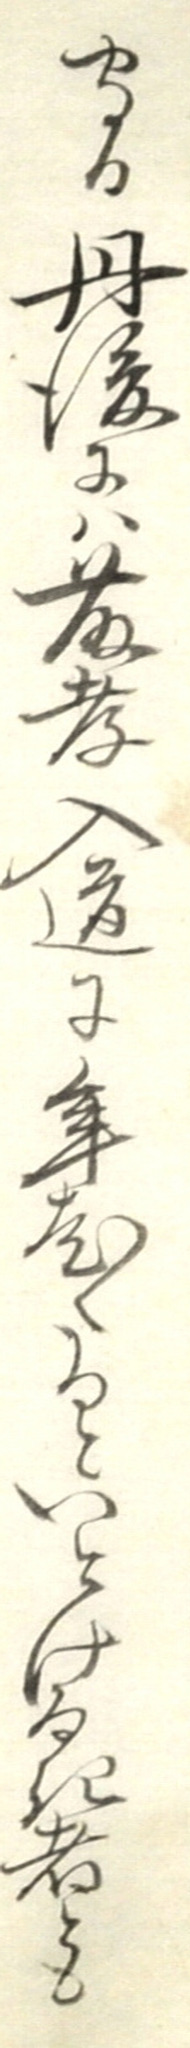守る丹後には藤孝入道に年老たるといとけなき者とも
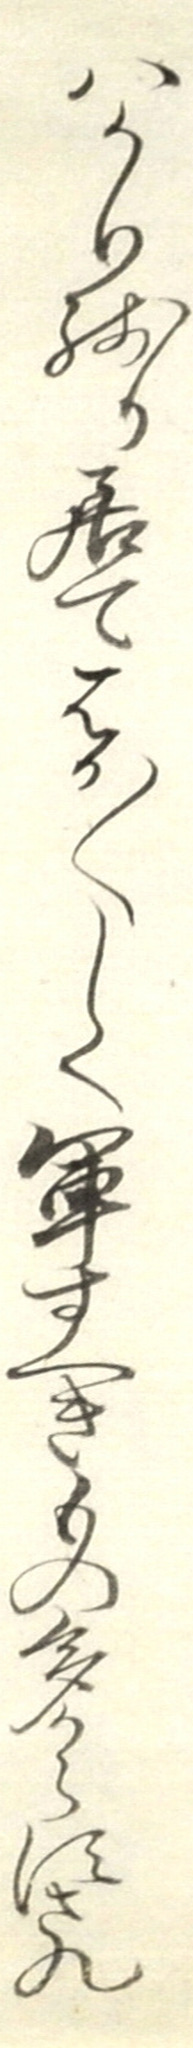はかり残り居てはか〳〵しく軍すへきもの多からすされ
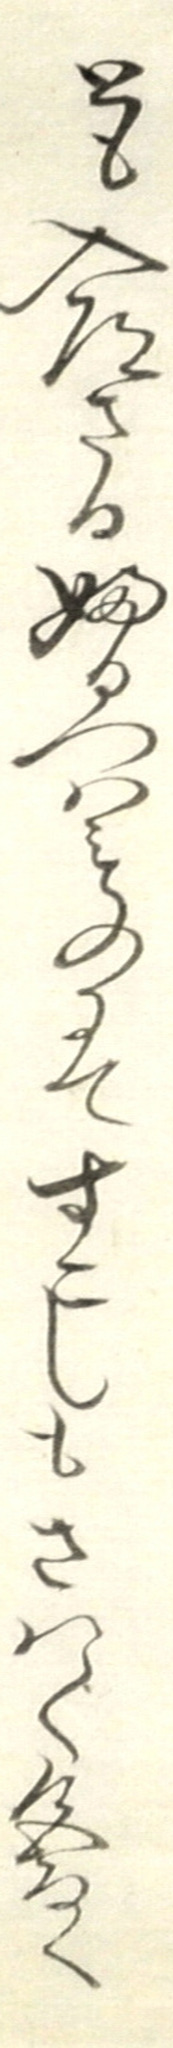とも入道さるふるつはものにてすこしもさわく色なく
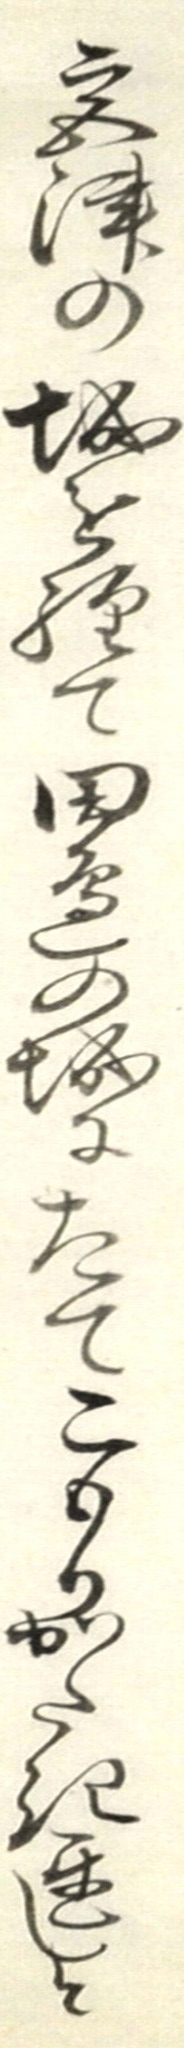宮津の城を経て田辺の城にたてこもりかたき遅しと
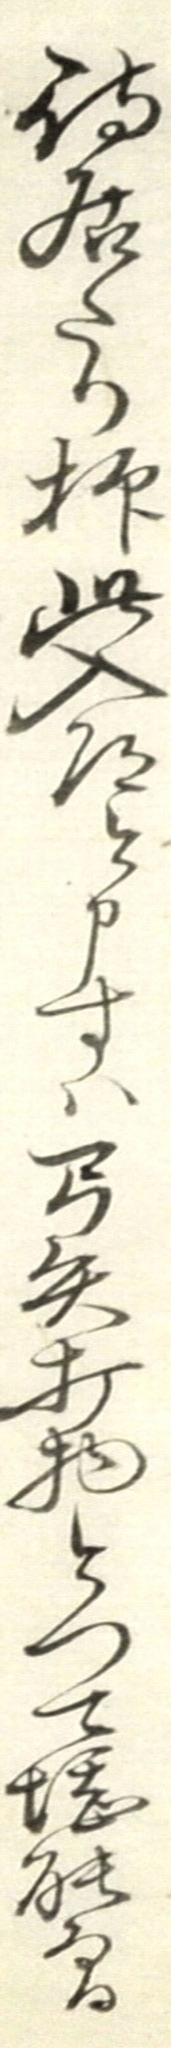待居たり抑此入道と申すは弓矢打物とつて堪能なる
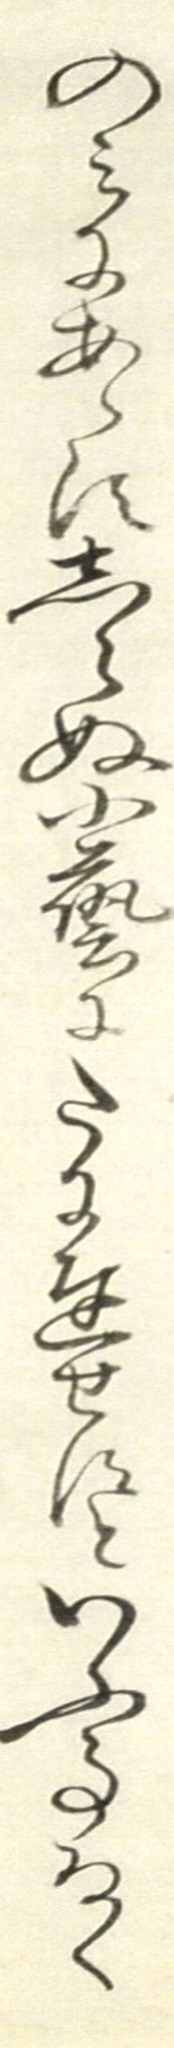のみにあらすしらぬ小芸にたに達せすといふ事なく
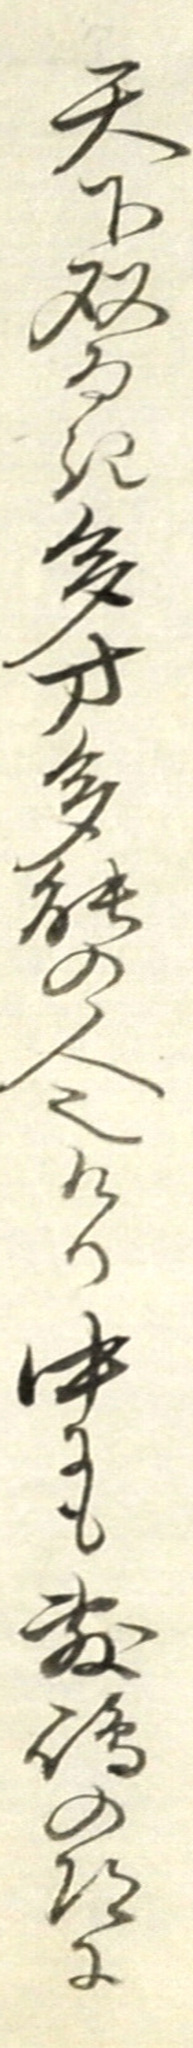天下双なき多才多能の人也けり中にも敷島の道に
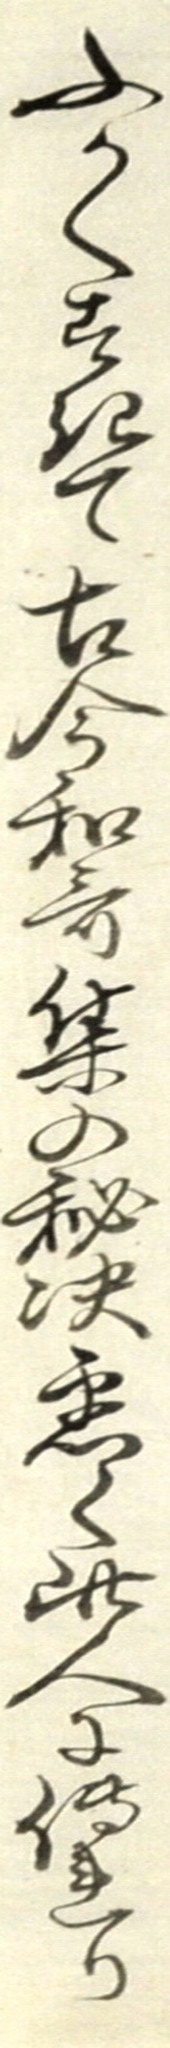ふかくすきて古今和哥集の秘訣悉く此人に伝れり
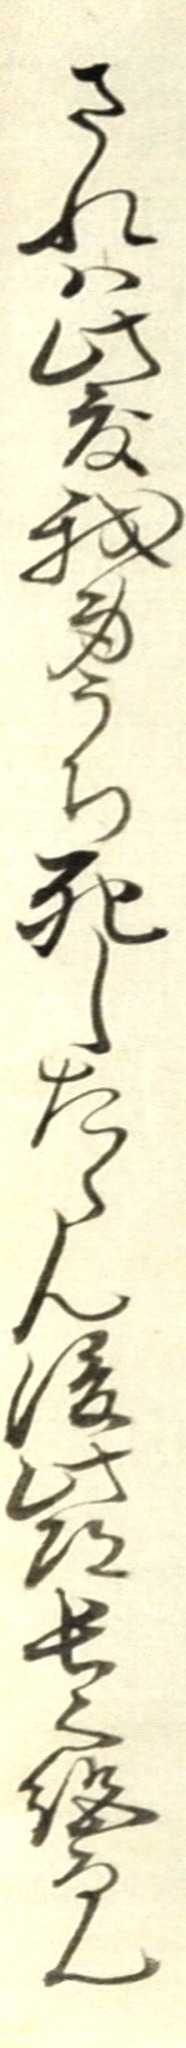されは此度我身うち死したらん後此道長く絶なん
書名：藩翰譜（七・下）
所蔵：伊那市立高遠町図書館・合同会社AMANE
